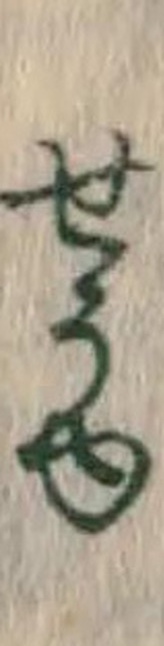せうゆ
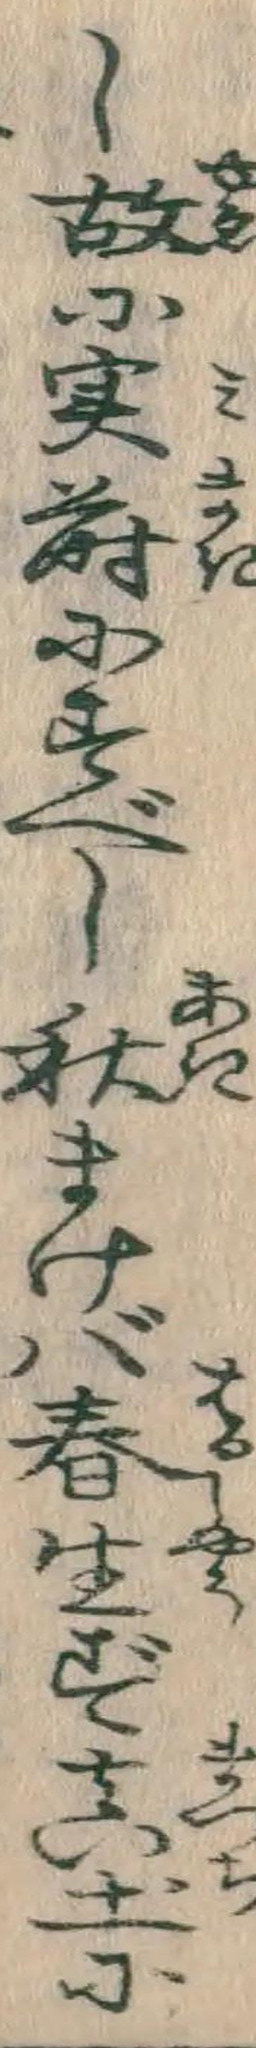し故に実蒔にすべし秋まけば春生ず真土に
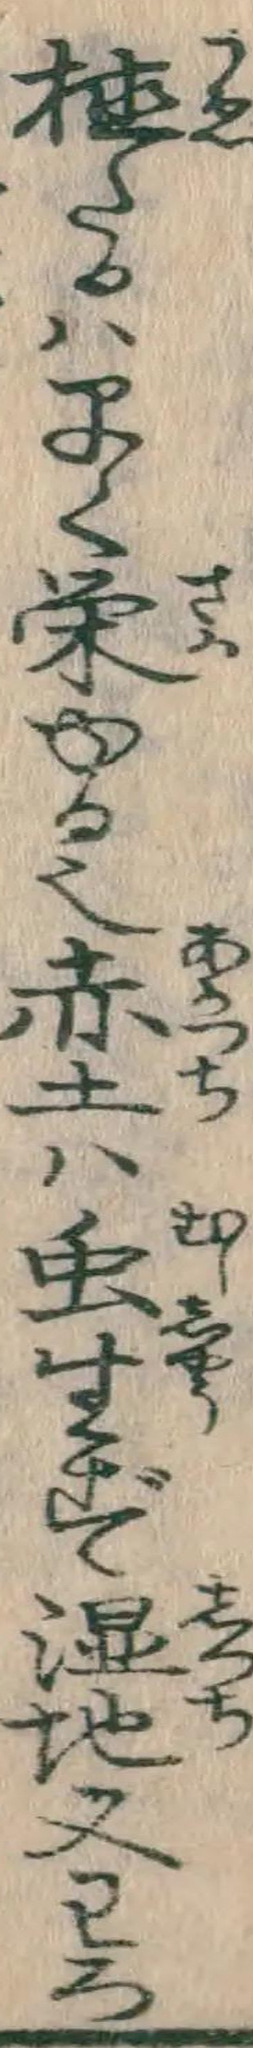植たるは早く栄ゆる也赤土は虫生ず湿地又わろ
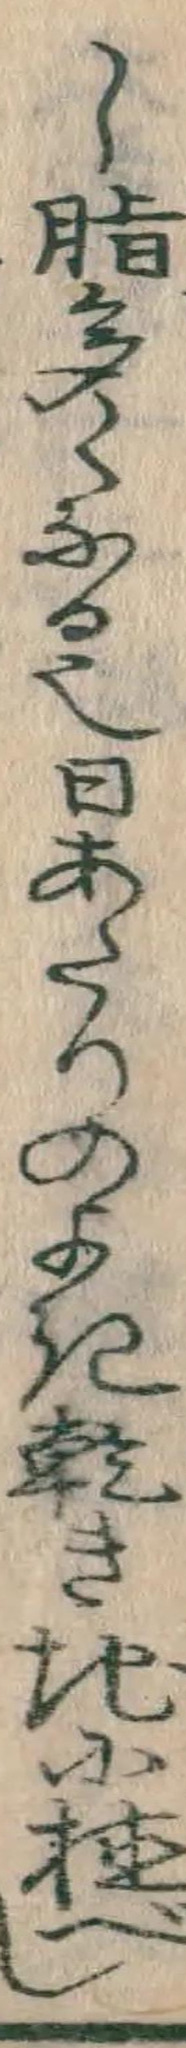し脂多くなる也日あたりのよき乾き地に植べし
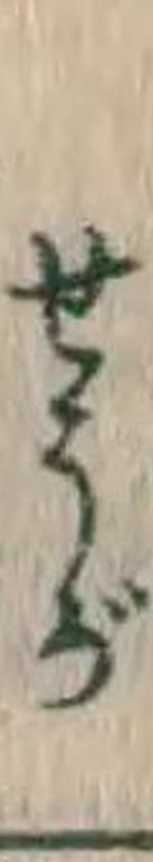せうゆ
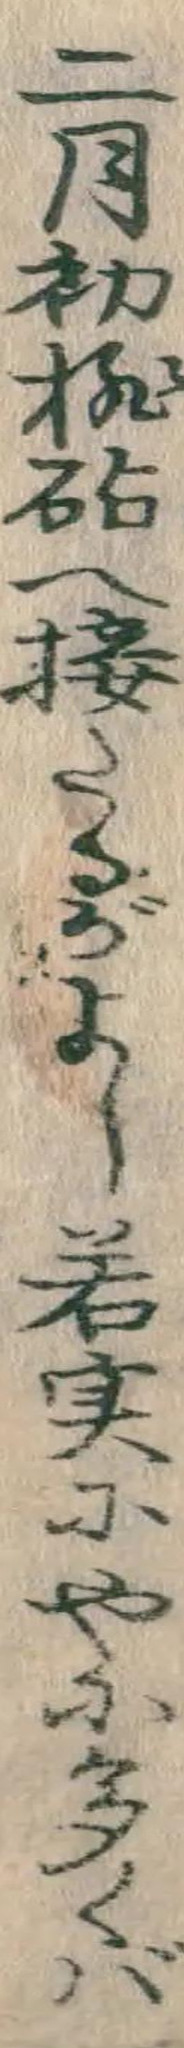二月初桃砧へ接たるがよし若実にやに多くば
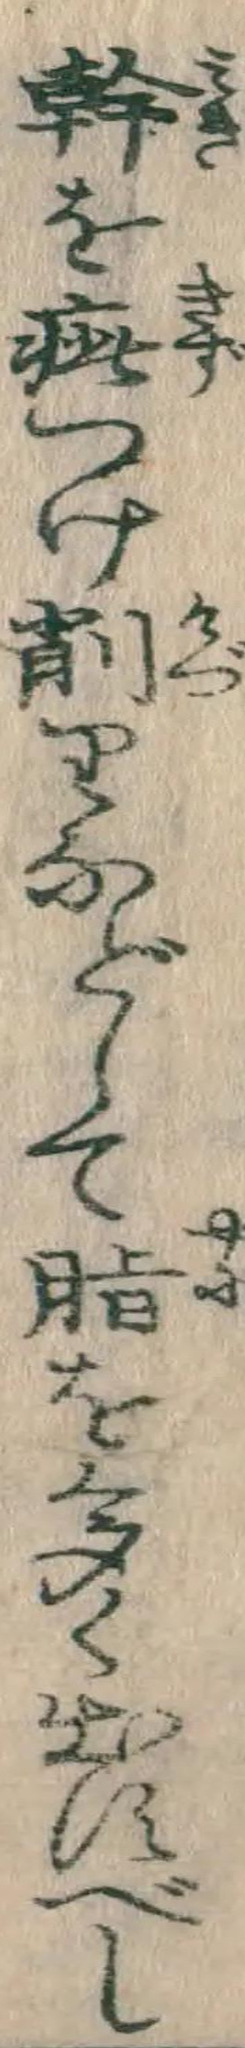幹を疵つけ削りなどして脂を多く出すべし
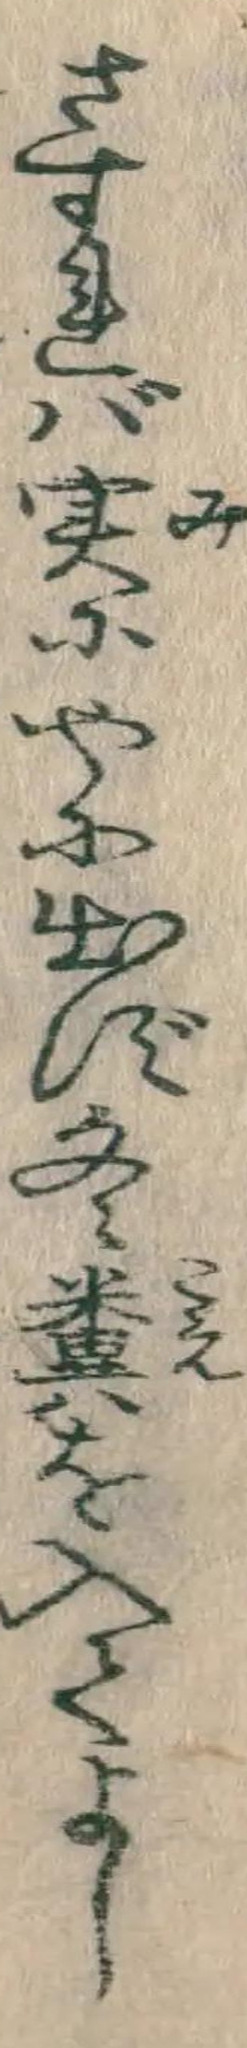さすれば実にやに出ず冬糞を入てよし
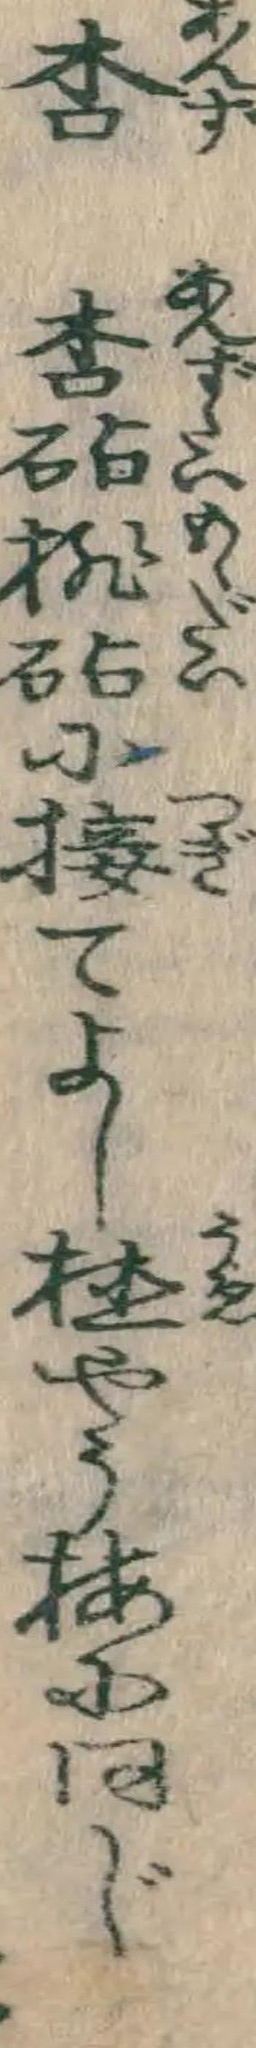一杏杏砧桃砧に接てよし植やう梅に同じ
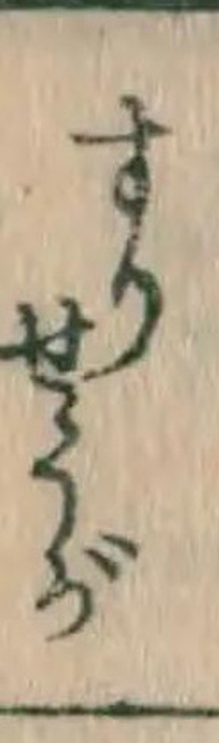せうゆ
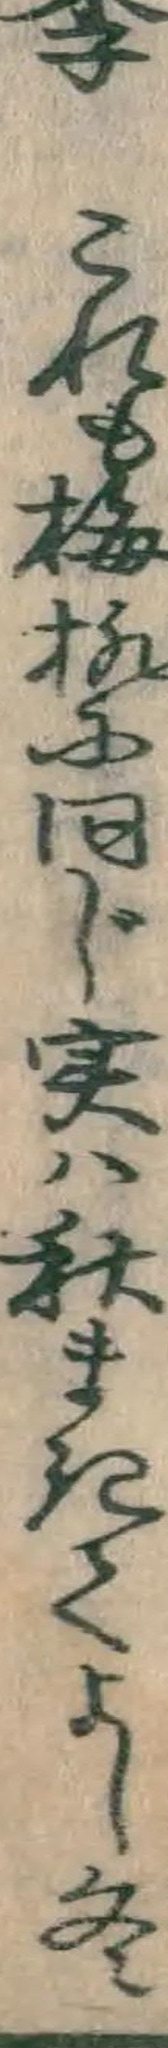一李これも梅桃に同じ実は秋まきてよし冬
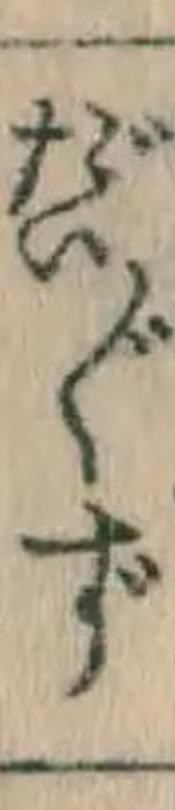だい〴〵ず
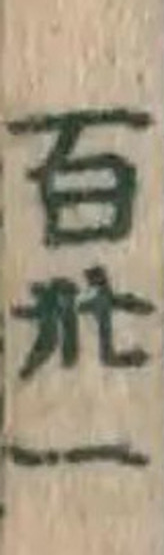百卅一

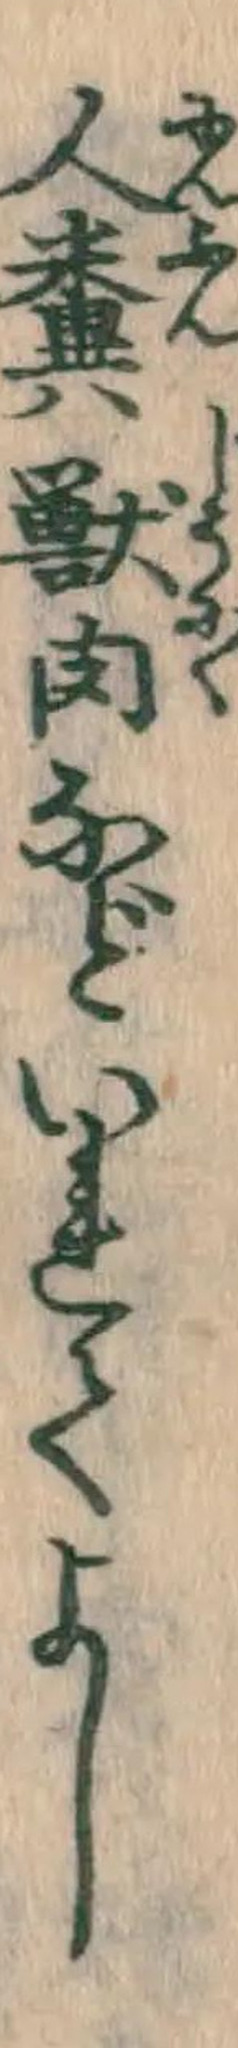人糞獣肉などいれてよし
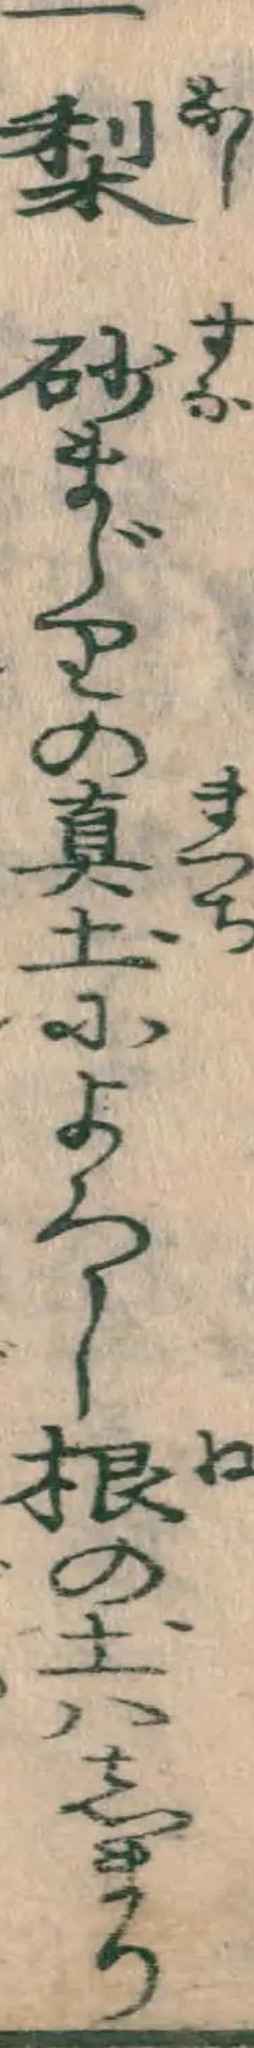一梨砂まじりの真土によろし根の土はしまり
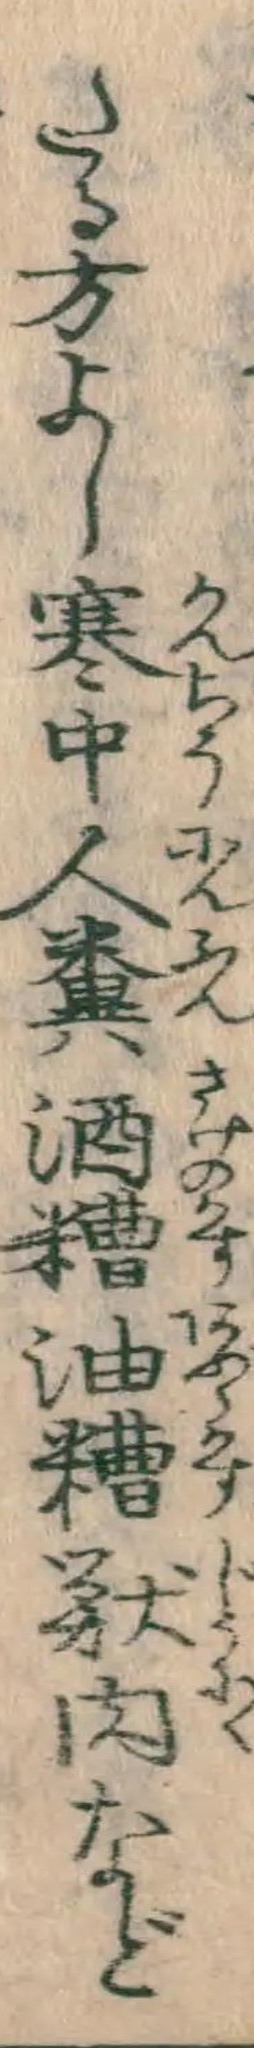たる方よし寒中人糞酒糟油糟獣肉など
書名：広益秘事大全 3巻. [5]
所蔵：国立国会図書館 National Diet Library, JAPAN
